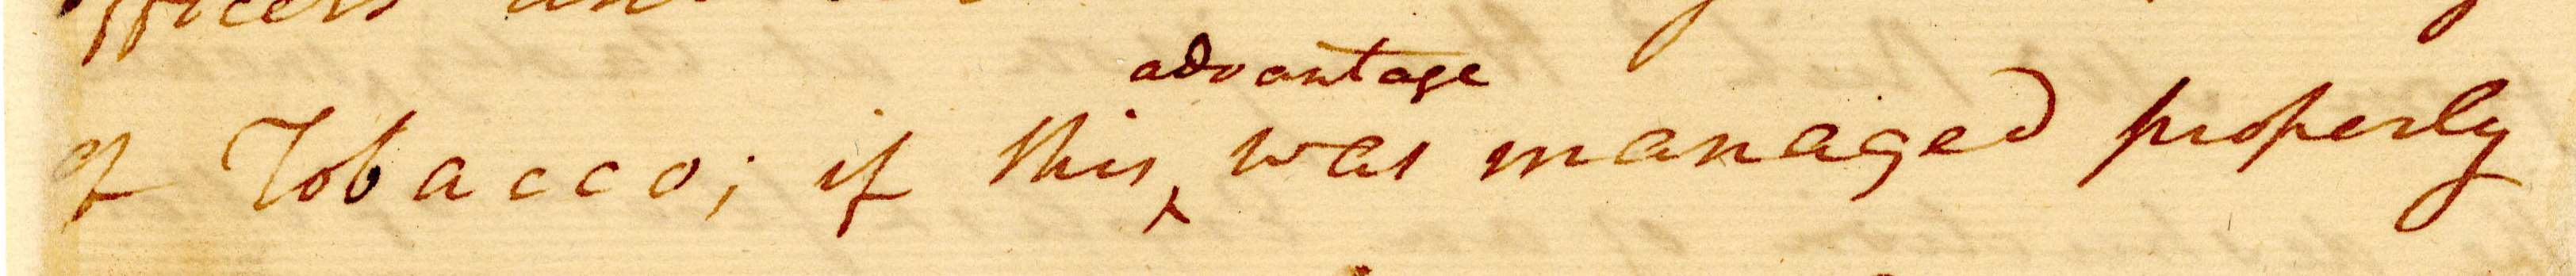of Tobacco, if this ^ was managed properly
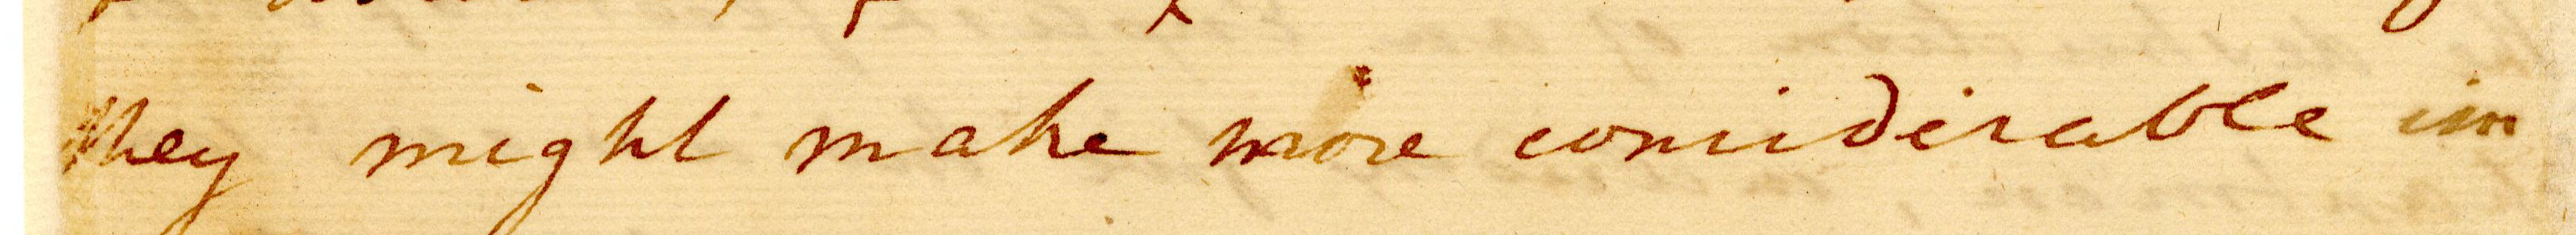they might make more considerable in
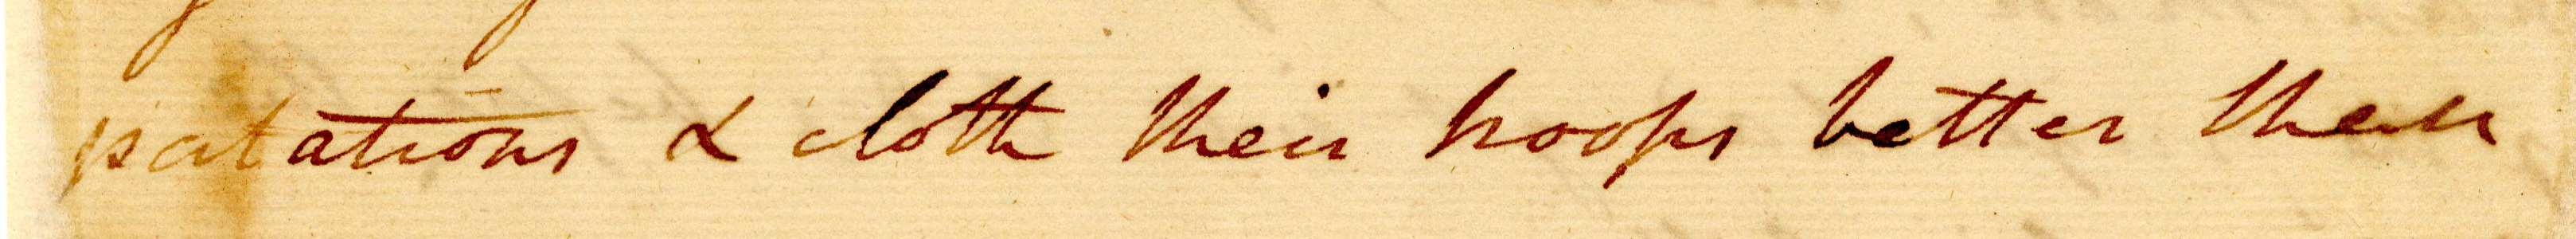rotations & cloth their troops better than
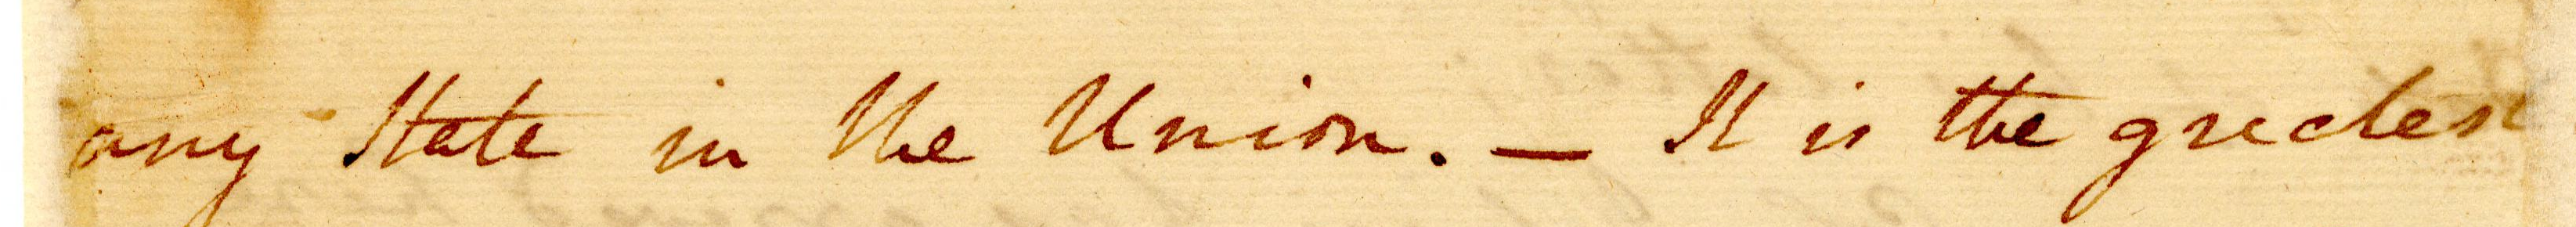any State in the Union.- It is the greatest
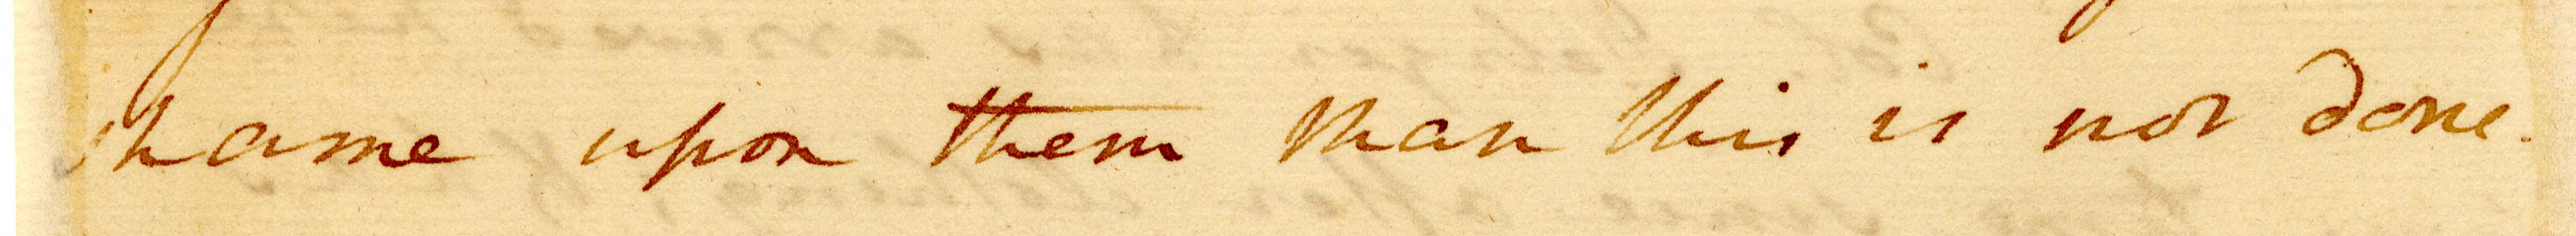shame upon them than this is not done.
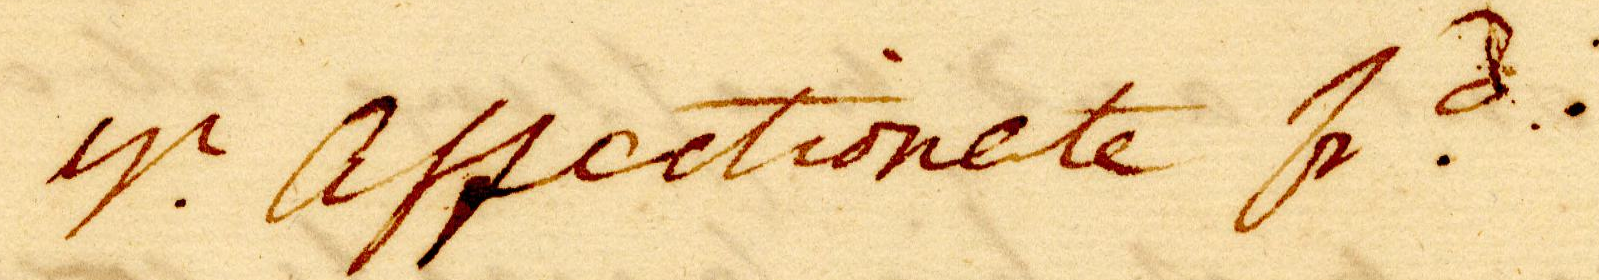Y^r. Affectionate fr^d.
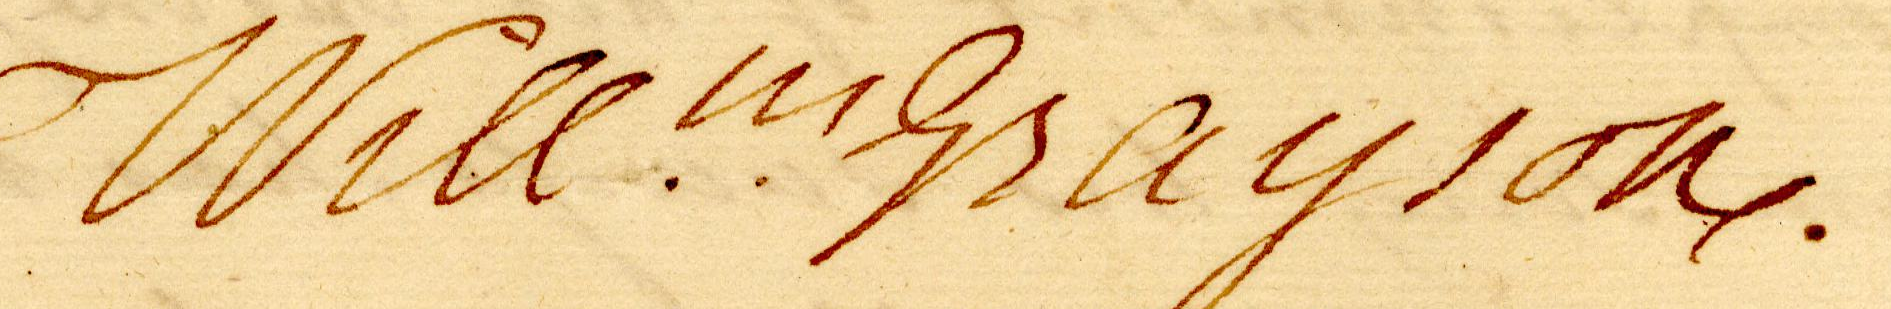Will^m. Grayson.
